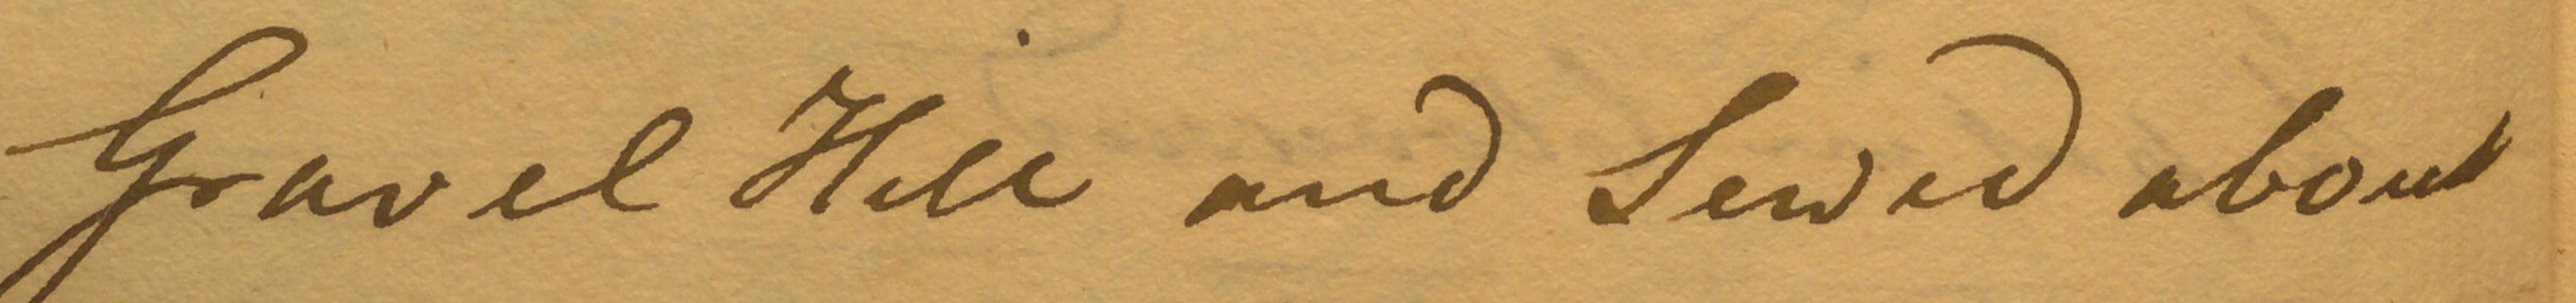Gravel Hill and Sewed about
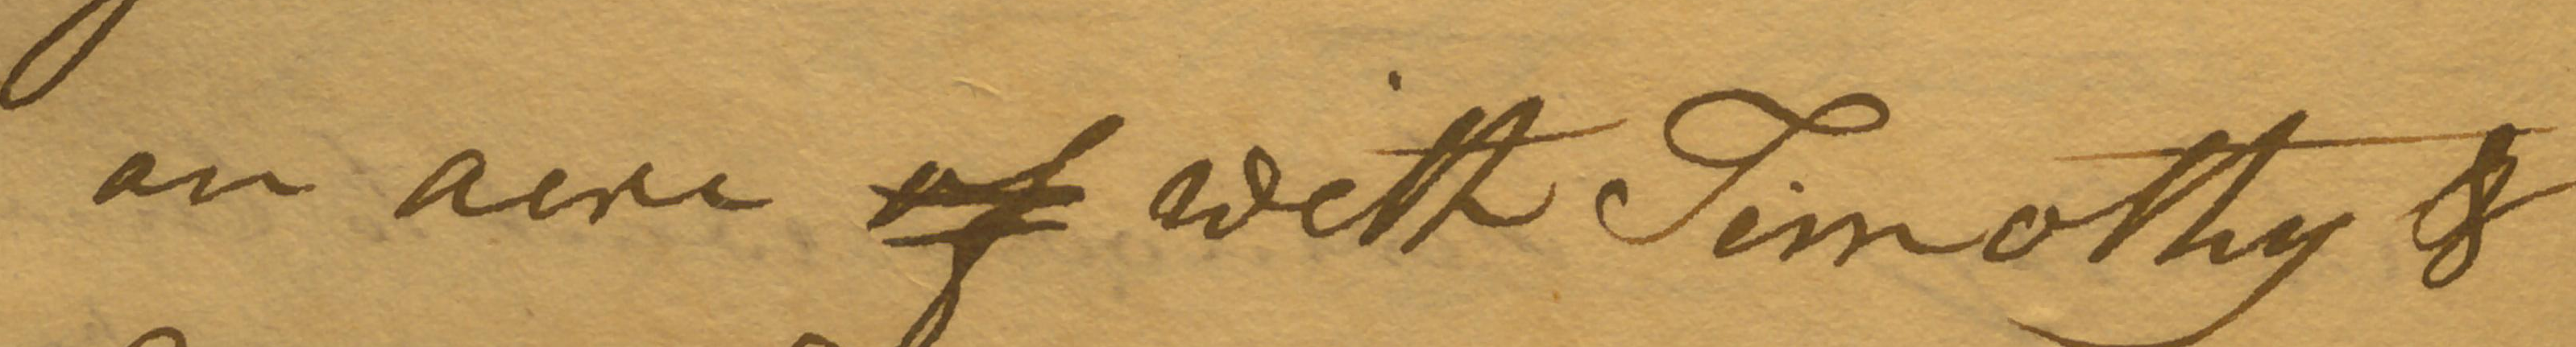an acre [of] with Timothy &
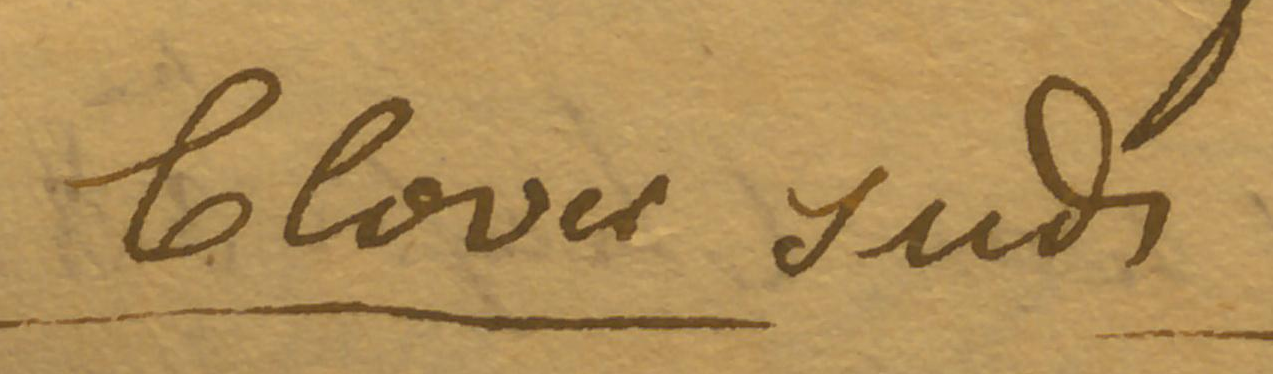Clover seed
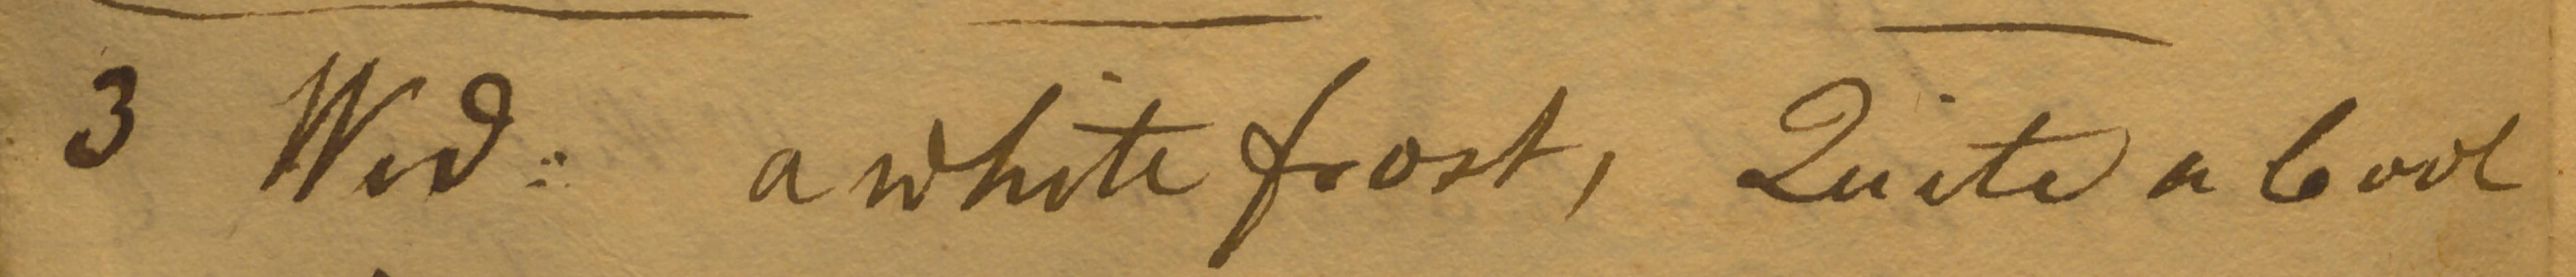3 Wed. a white frost, Quite a Cool
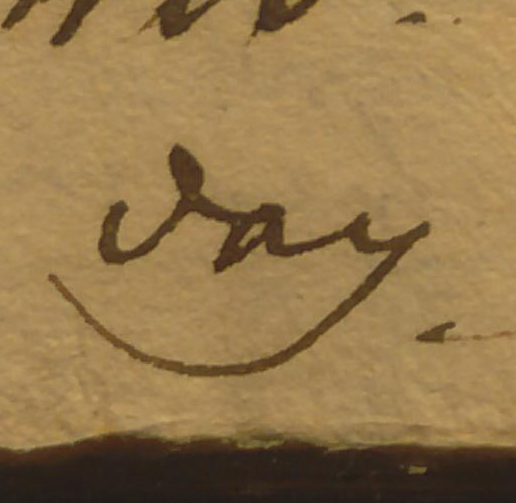day
